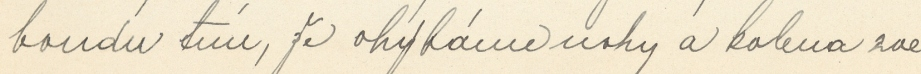boudu tím, že ohýbáme nohy a kolena zve-
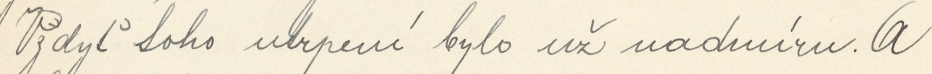Vždyť toho utrpení bylo už nadmíru. A
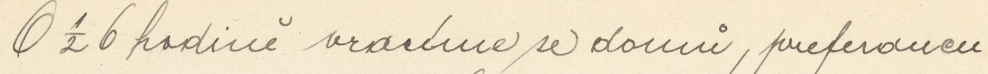O 1/2 6 hodině vracíme se domů, preferancu-
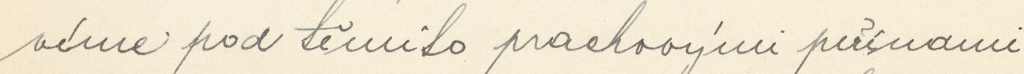víme pod těmito prachovými peřinami
